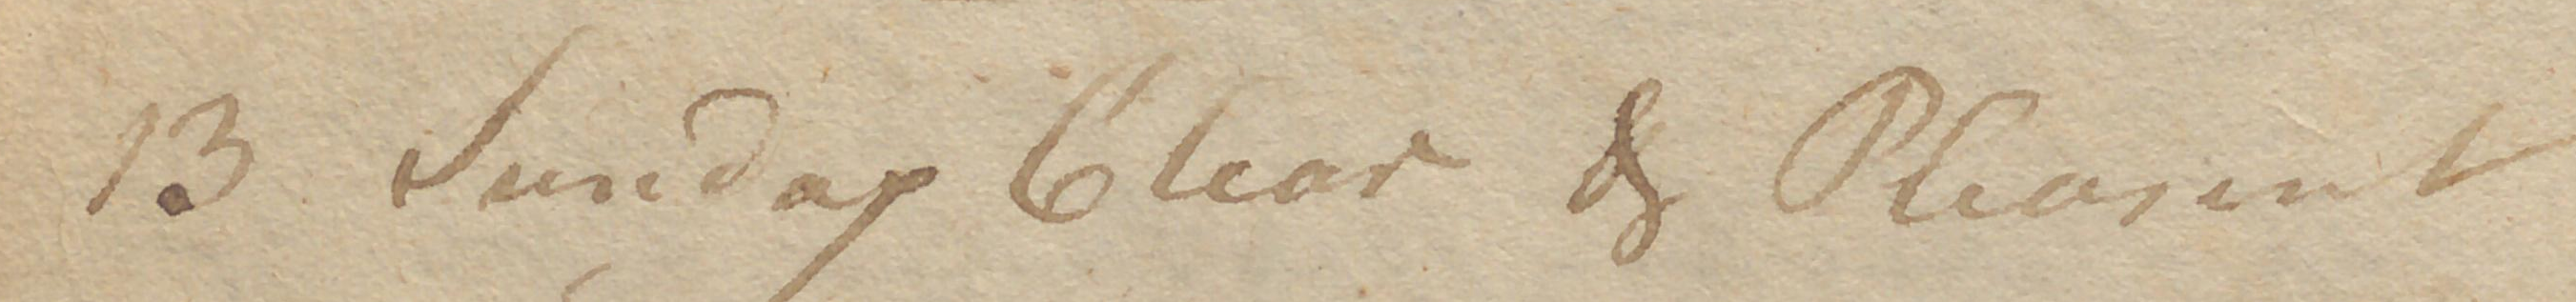13 Sunday Clear & Pleasent
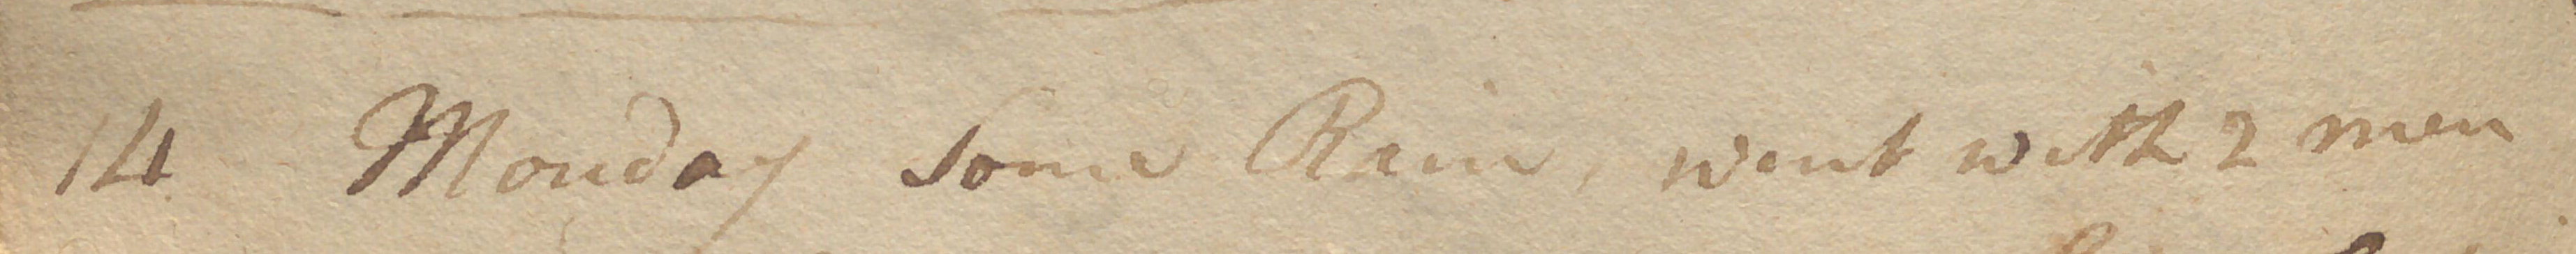14 Monday some Rain, went with 2 men
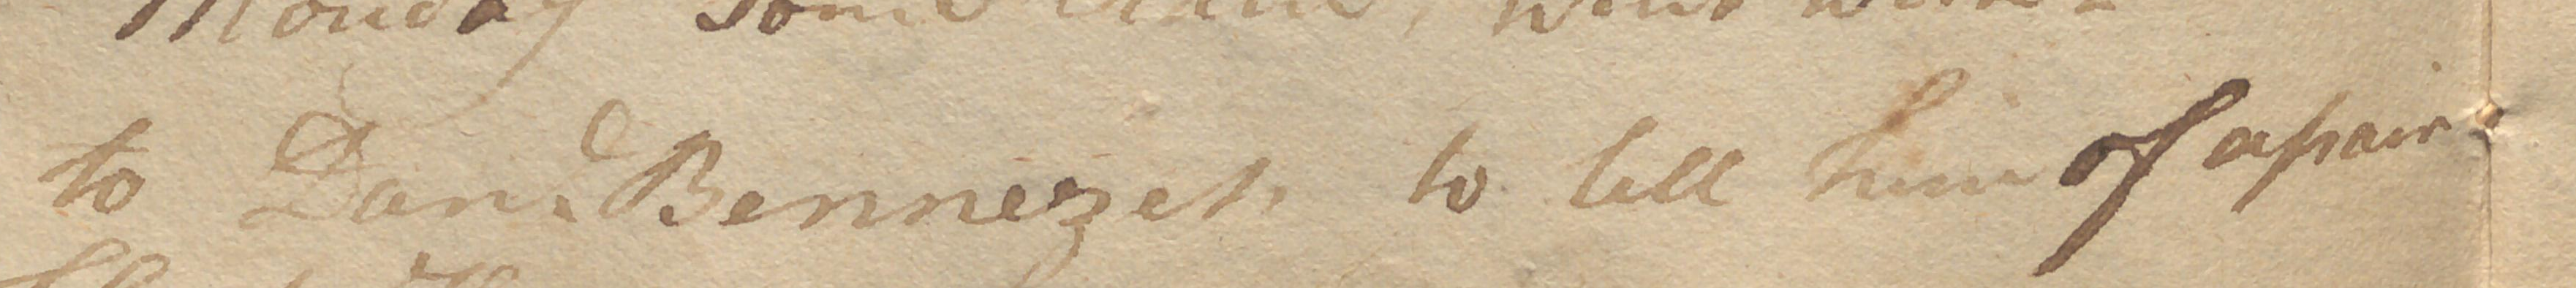to Danl. Bennezet, to tell him of a pair
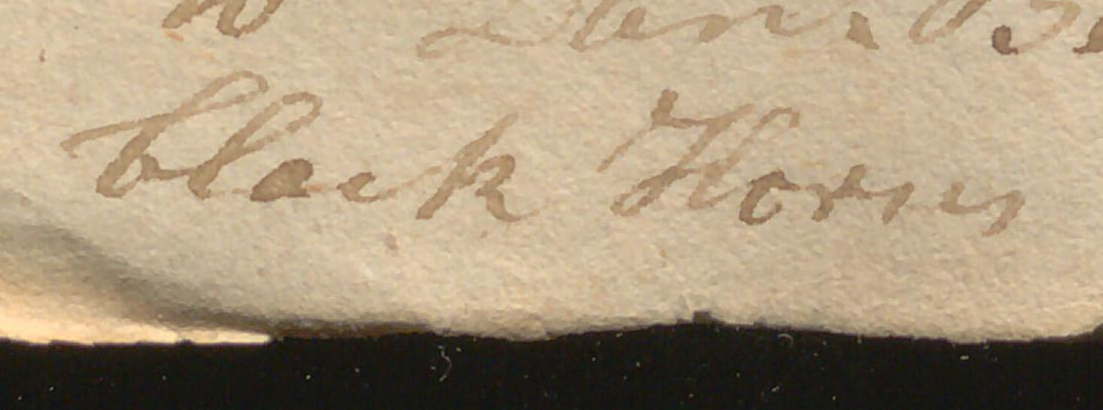black Horses
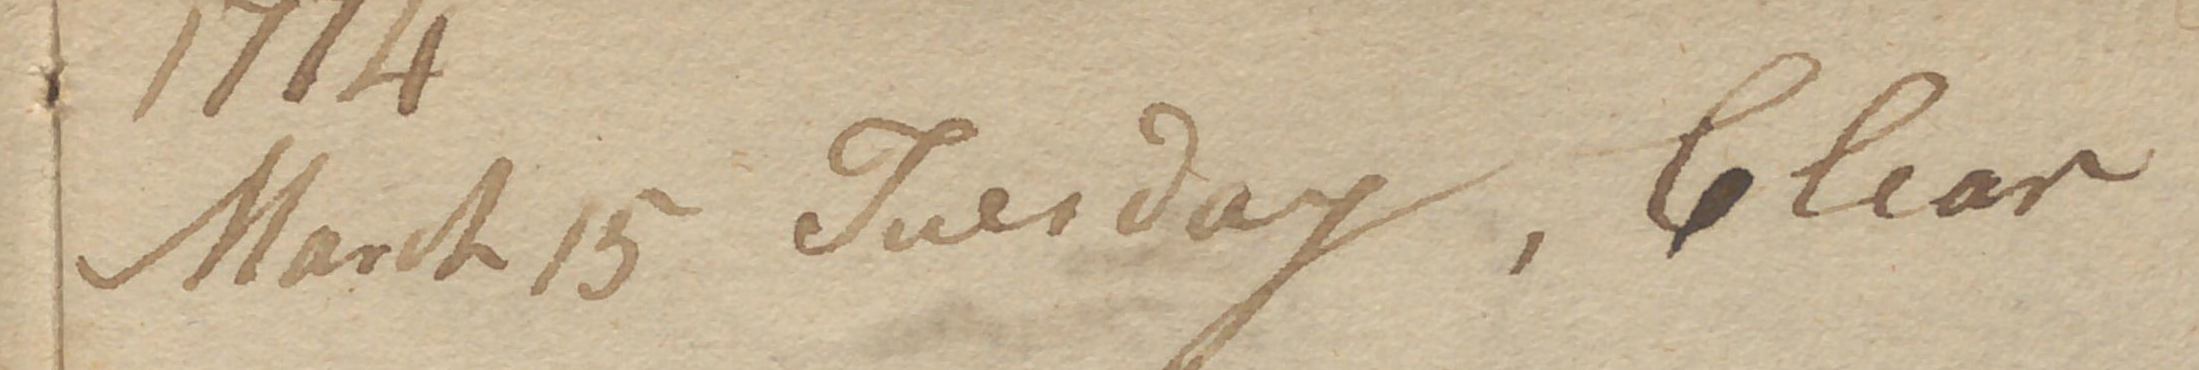March 15 Tuesday, Clear
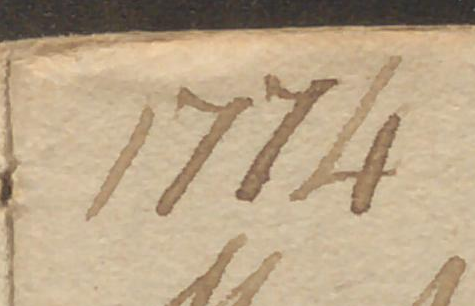1774
